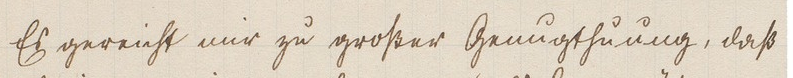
Es gereicht mir zu großer Genugthuung, daß
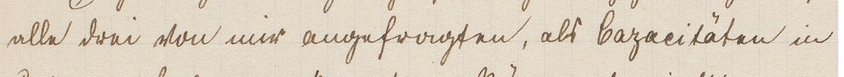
alle drei von mir angefragten, als Capacitäten in
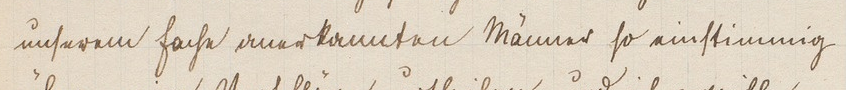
unserem Fache anerkannten Männer so einstimmig
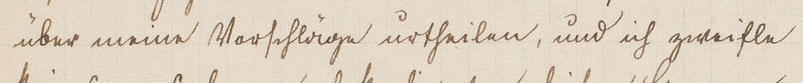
über meine Vorschläge urtheilen, und ich zweifle
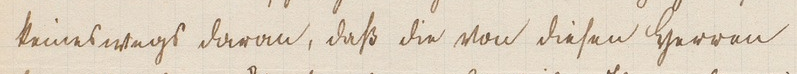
keineswegs daran, daß die von diesen Herren
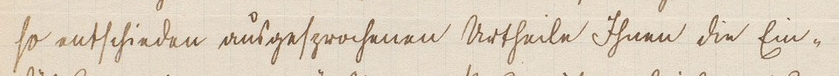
so entschieden ausgesprochenen Urtheile Ihnen die Ein-
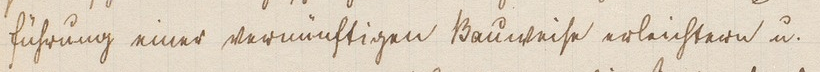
führung einer vernünftigen Bauweise erleichtern u.
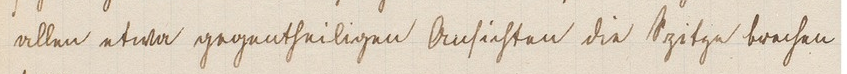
allen etwa gegentheiligen Ansichten die Spitze brechen
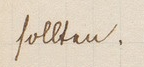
sollten.
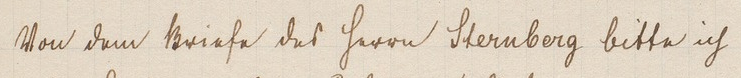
Von dem Briefe des Herrn Sternberg bitte ich
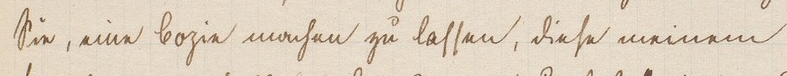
Sie, eine Copie machen zu lassen, diese meinem
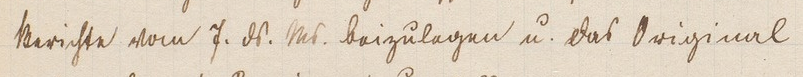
Berichte vom 7. ds. Ms. beizulegen u. das Original
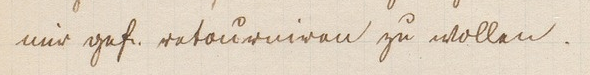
mir gef. retourniren zu wollen.
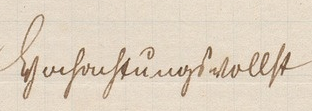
Hochachtungsvollst
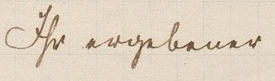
Ihr ergebener
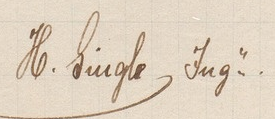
H. Single Ingr
